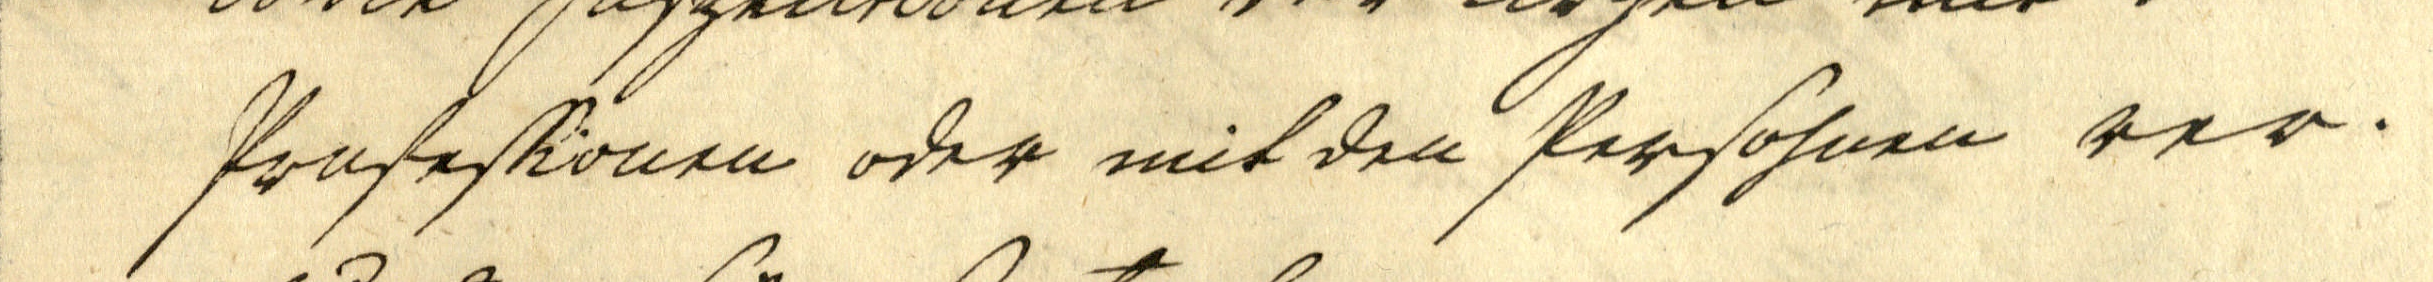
Professionen oder mit den Persohnen ver-
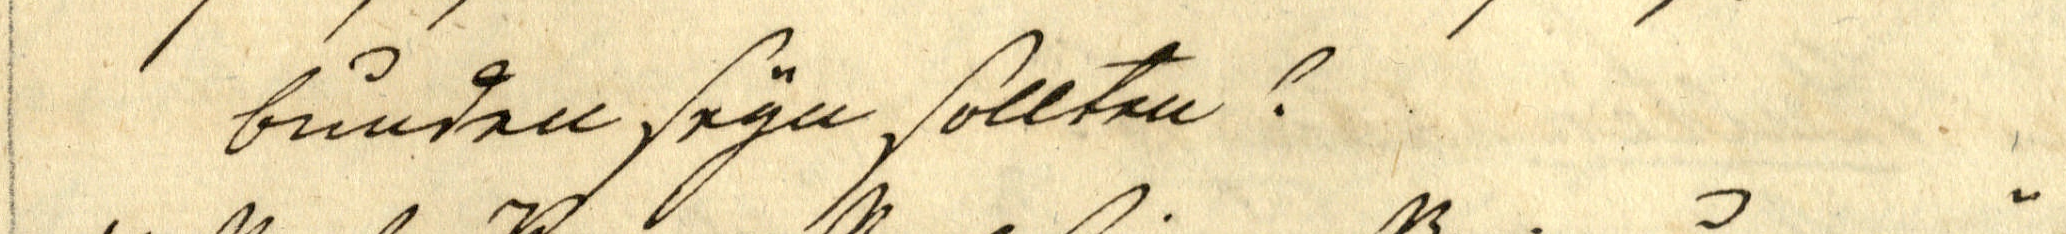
bunden seyn sollten?
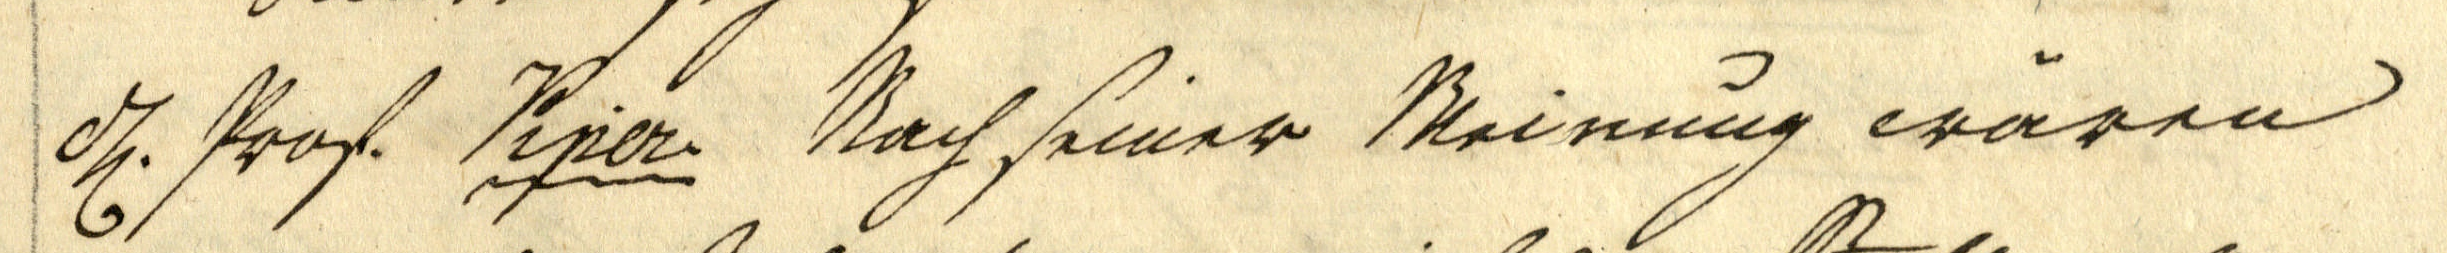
dh. Prof. Piper Nach seiner Meinung wären
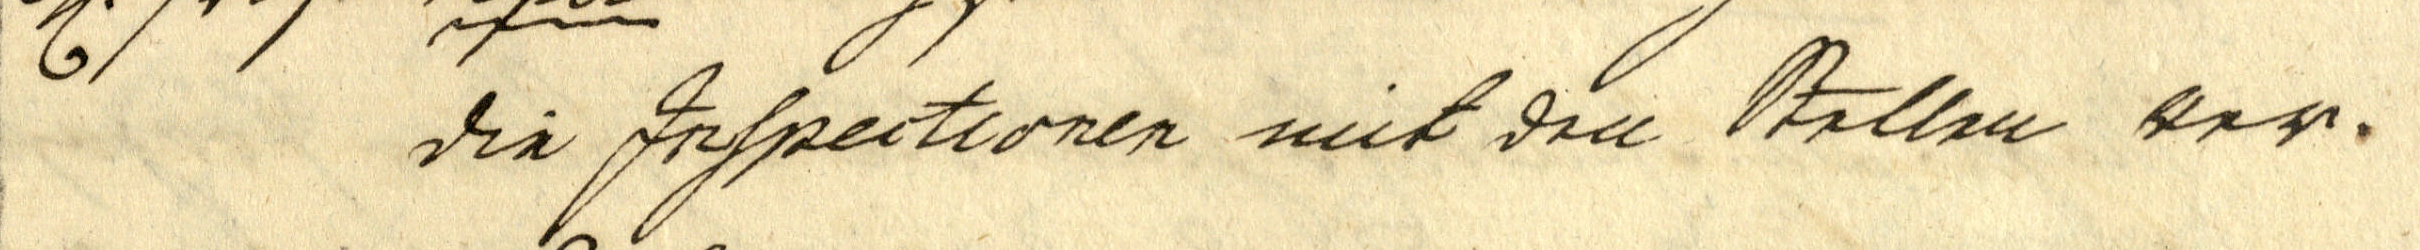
die Inspectionen mit den Stellen ver-
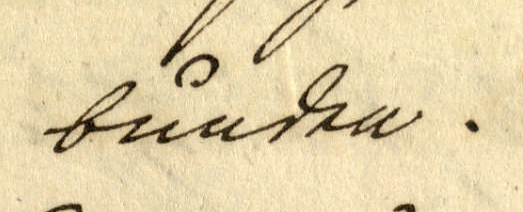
bunden.
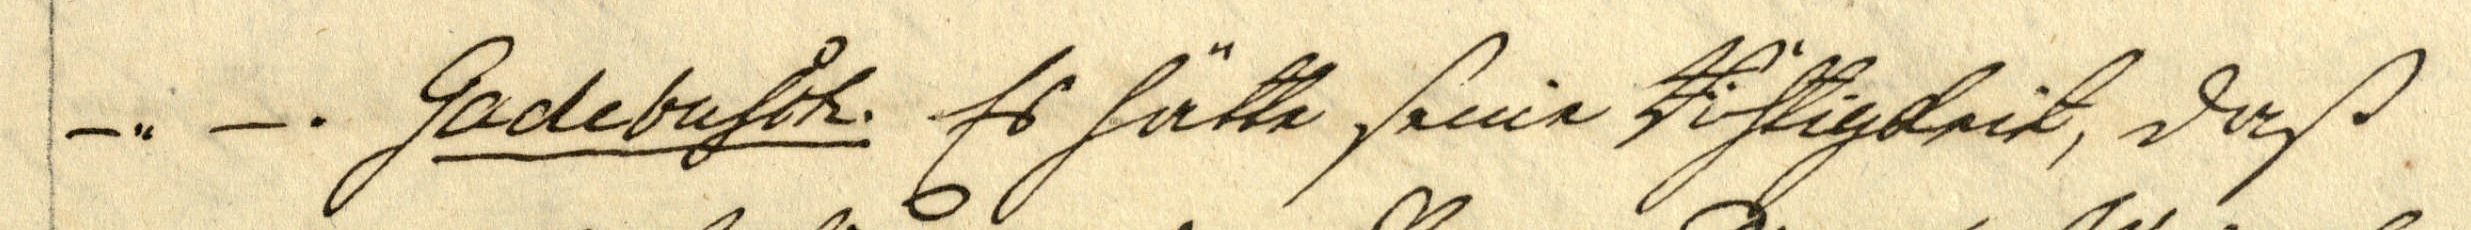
- " - " Gadebusch. Es hätte seine Richtigkeit, daß
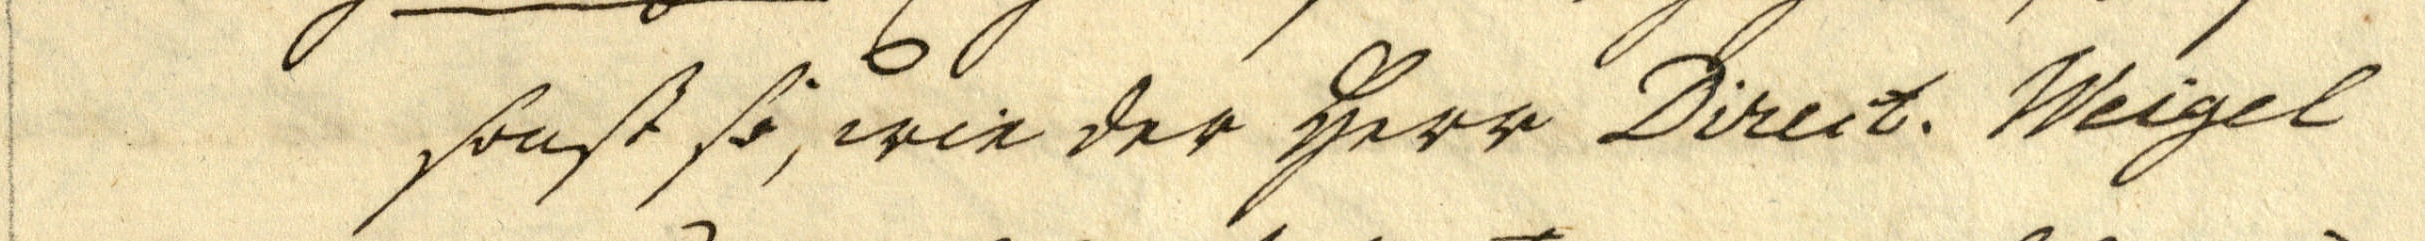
sonst so, wie der Herr Direct. Weigel
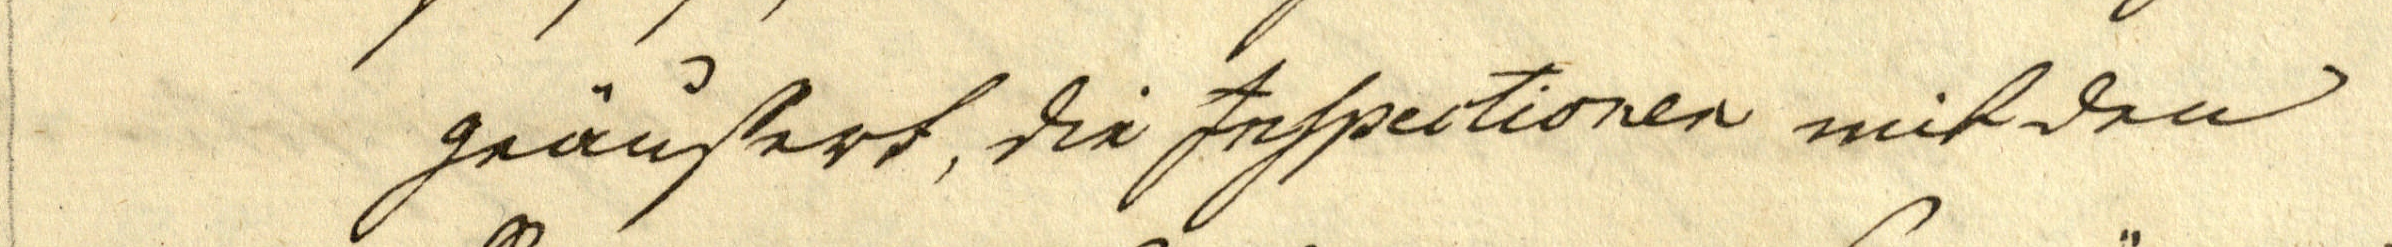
geäussert, die Inspectionen mit den
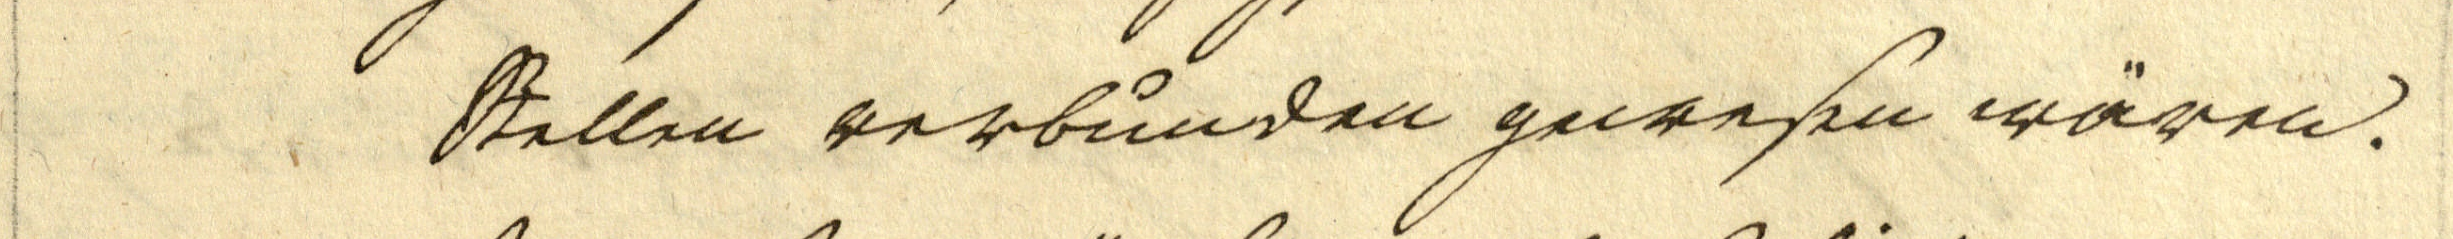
Stellen verbunden gewesen wären.
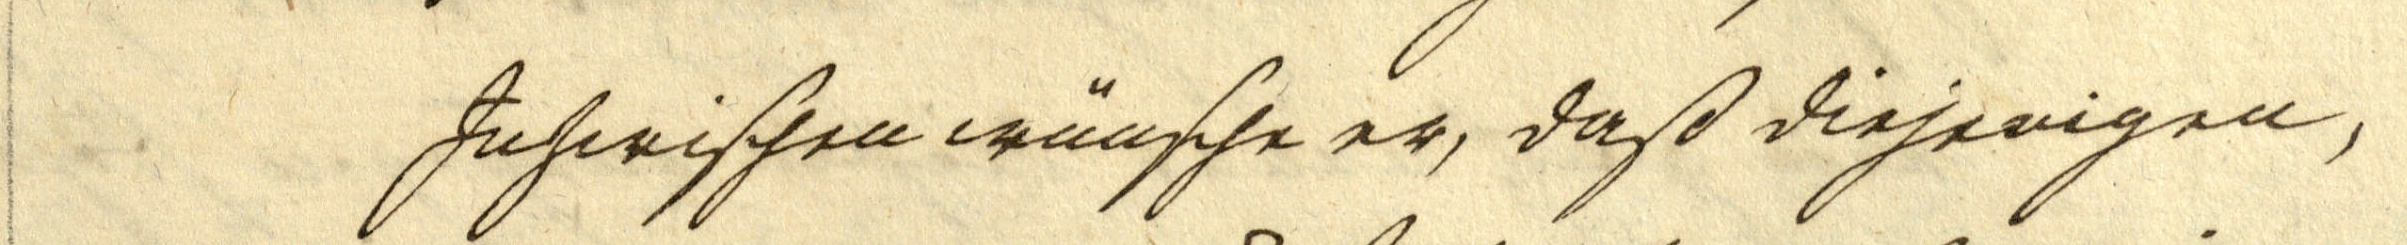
Inzwischen wünsche er, daß diejenigen,
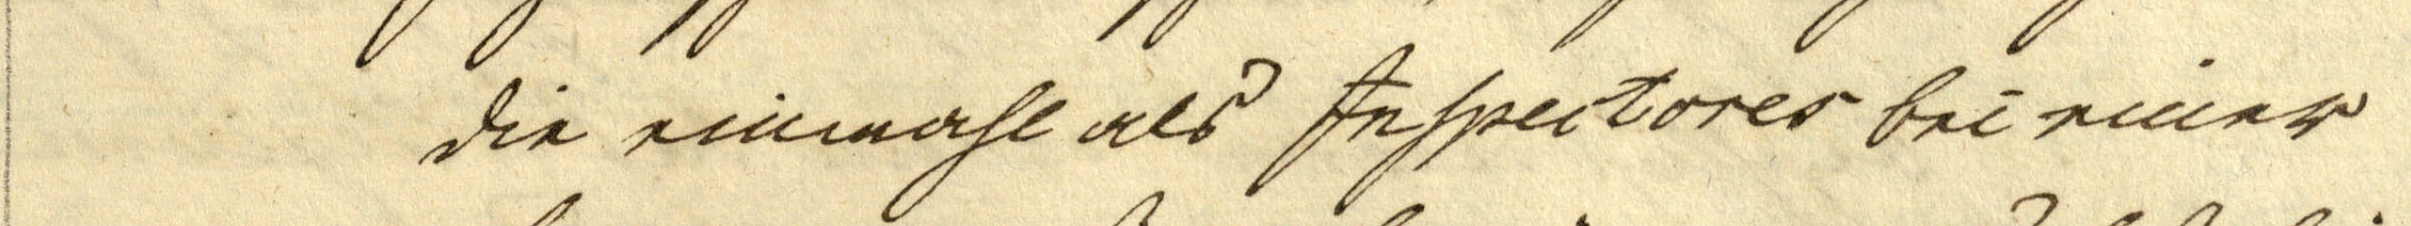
die einmahl als Inspectores bei einer
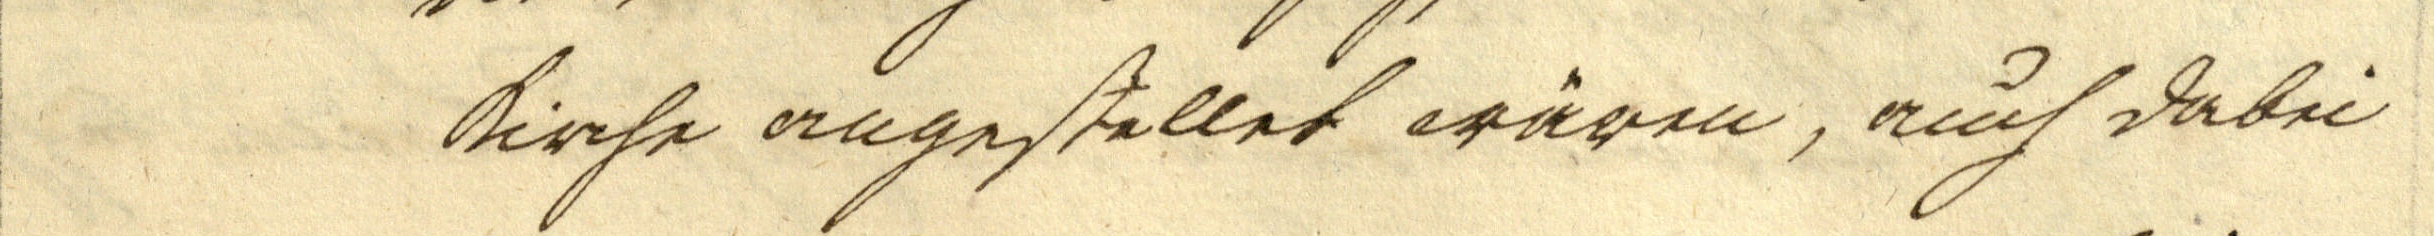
Kirche angestellet wären, auch dabei
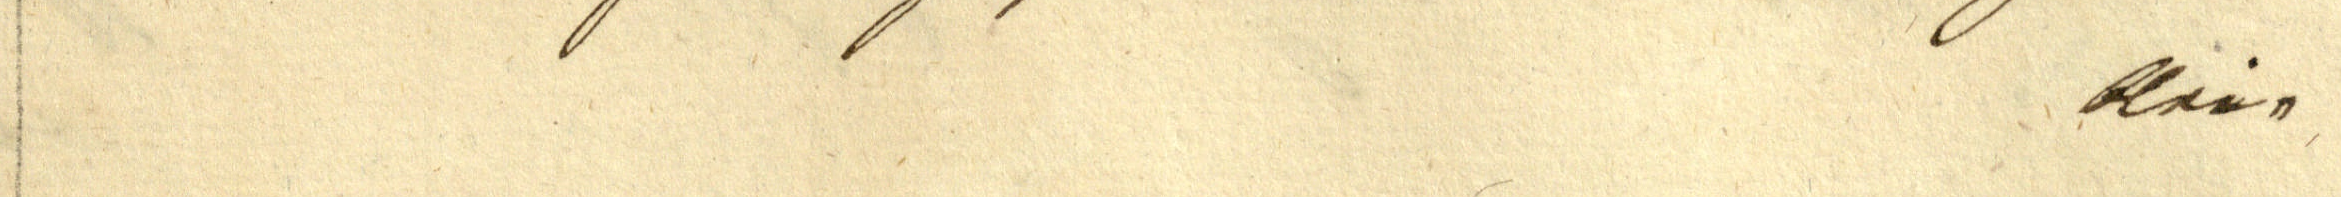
blei-
